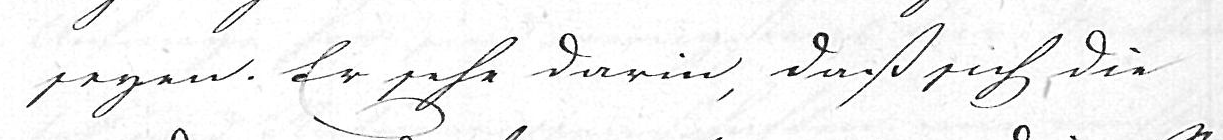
seyen Er sehe darin, daß sich die
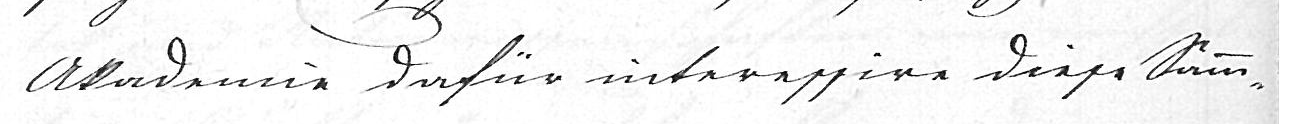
Akademie dafür interessire diese Samm-
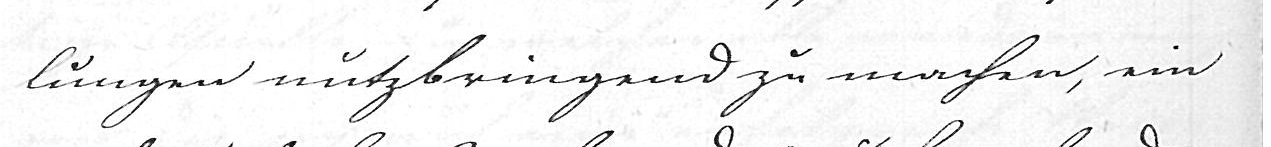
lungen nutzbringend zu machen, ein
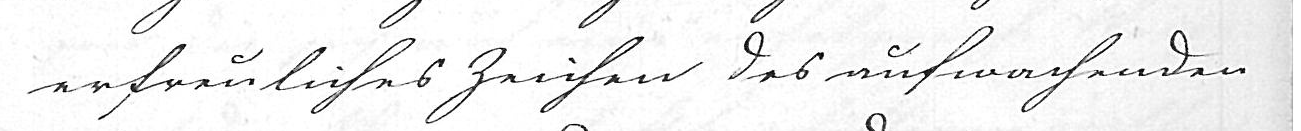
erfreuliches Zeichen des aufwachenden
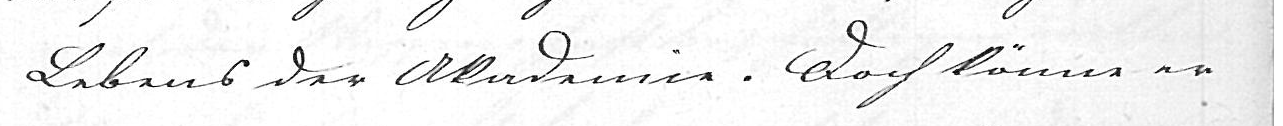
Lebens der Akademie. Doch könne er
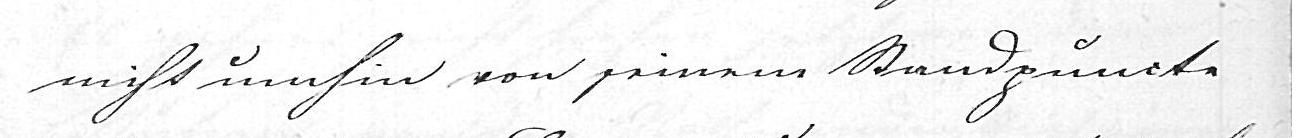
nicht umhin von seinem Standpuncte
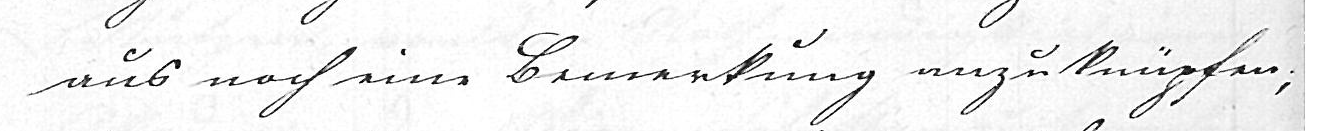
aus noch einem Bemerkung anzuknüpfen,
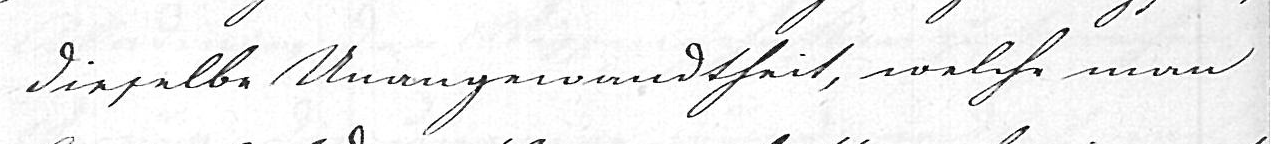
dieselbe Unangewandtheit, welche man
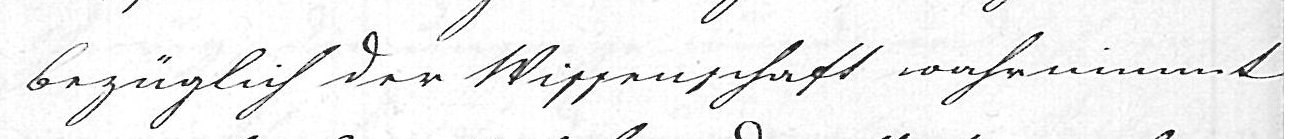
bezüglich der Wissenschaft wahr nimmt
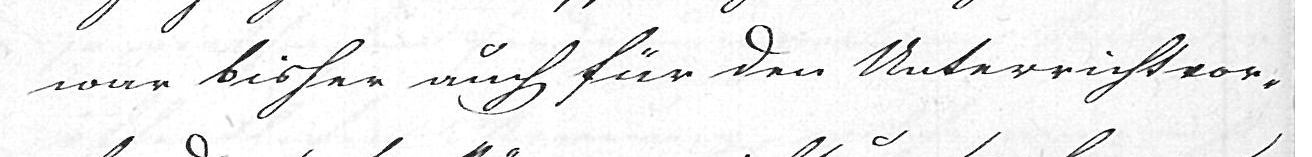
war bisher auch für den Unterricht vor-
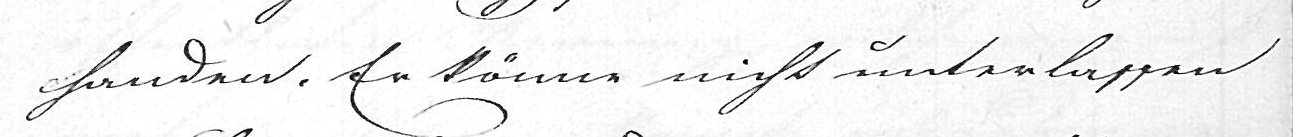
handen. Er könne nicht unterlassen
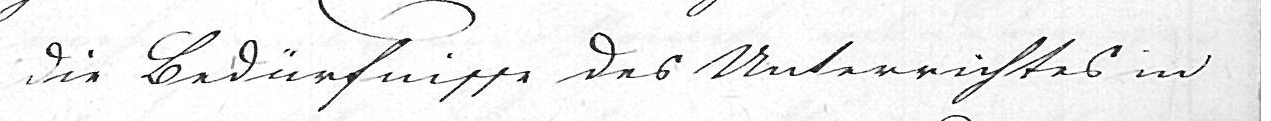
die Bedürfnisse des Unterrichtes in
